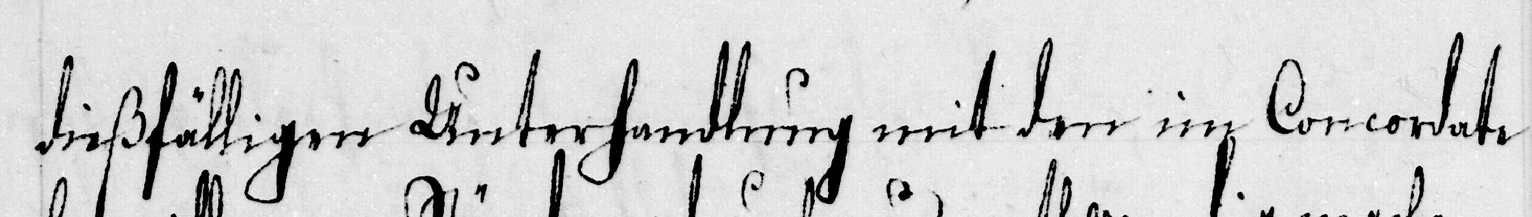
dießfälligen Unterhandlung mit den im Concordate
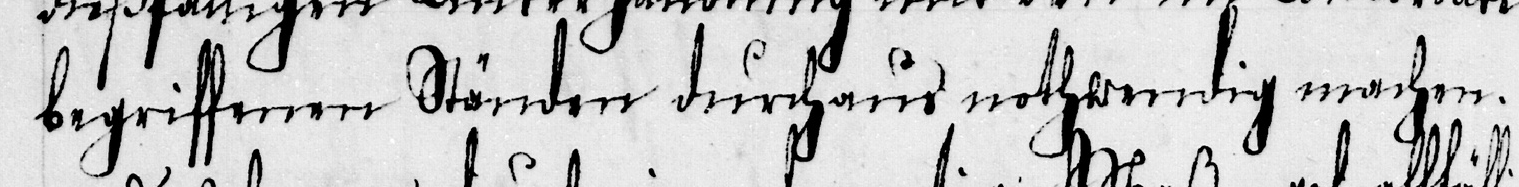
begriffenen Ständen durchaus nothwendig machen.
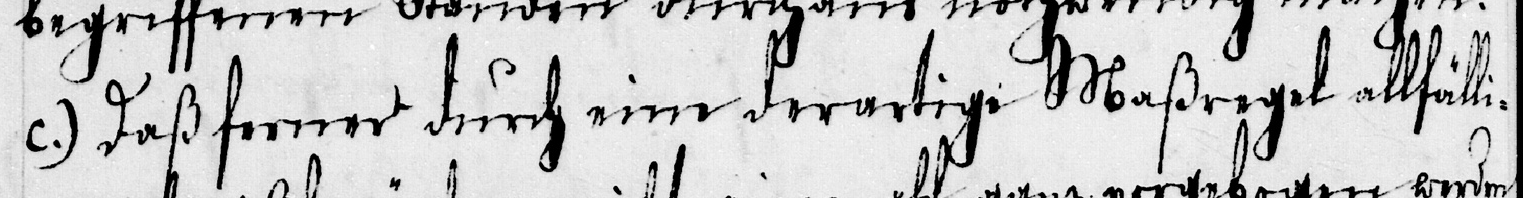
c.) Daß ferner durch eine derartige Maßregel allfäl¬
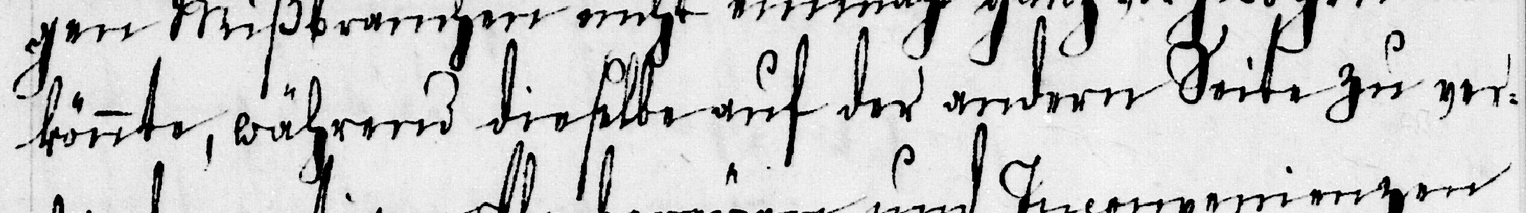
könnte, während dieselbe auf der andern Seite zu ver¬
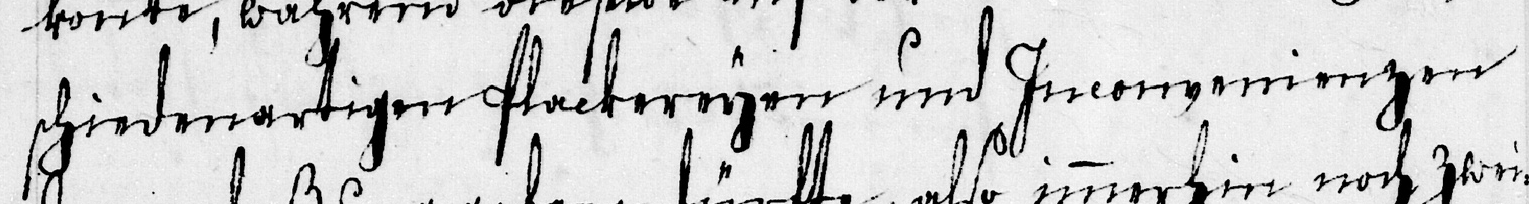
schiedenartigen Plackereyen und Inconvenienzen
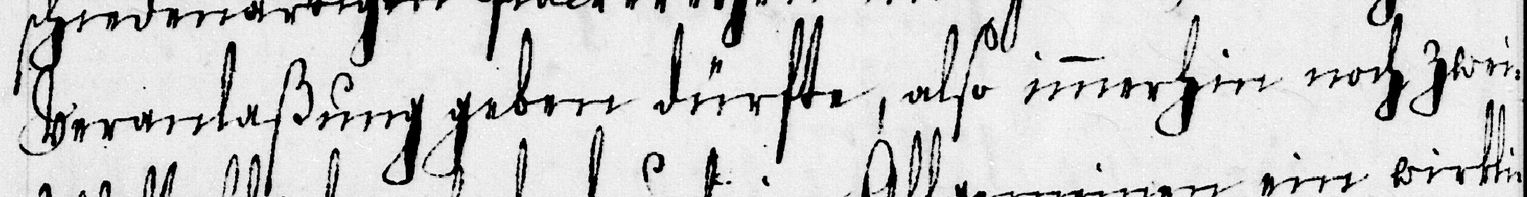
Veranlaßung geben dürfte, also immerhin noch zwei¬
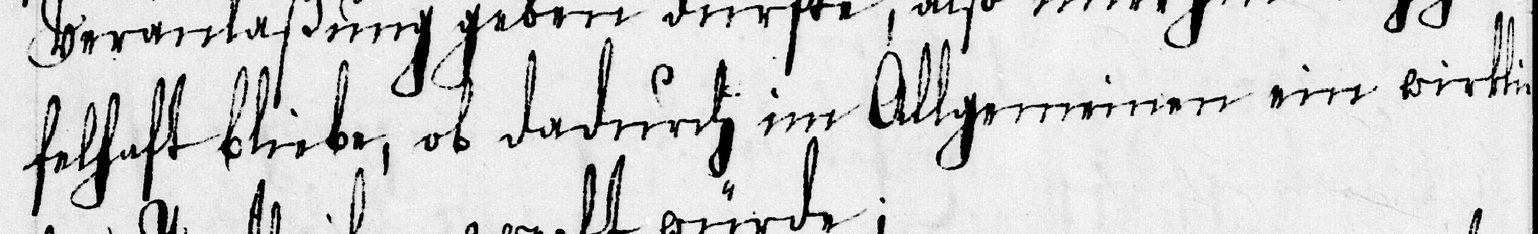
felhaft bliebe, ob dadurch im Allgemeinen ein wirkli¬
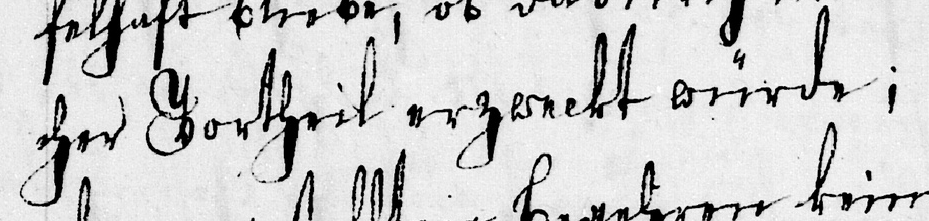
cher Vortheil erzweckt würde;
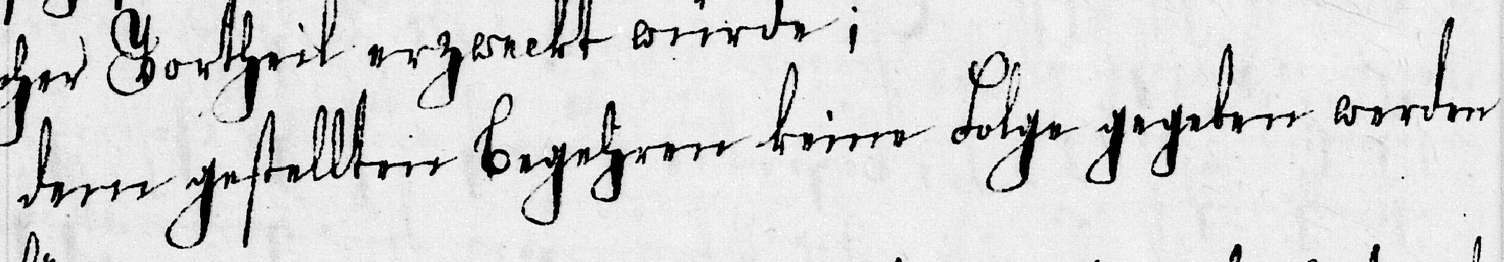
dem gestellten Begehren keine Folge gegeben werde
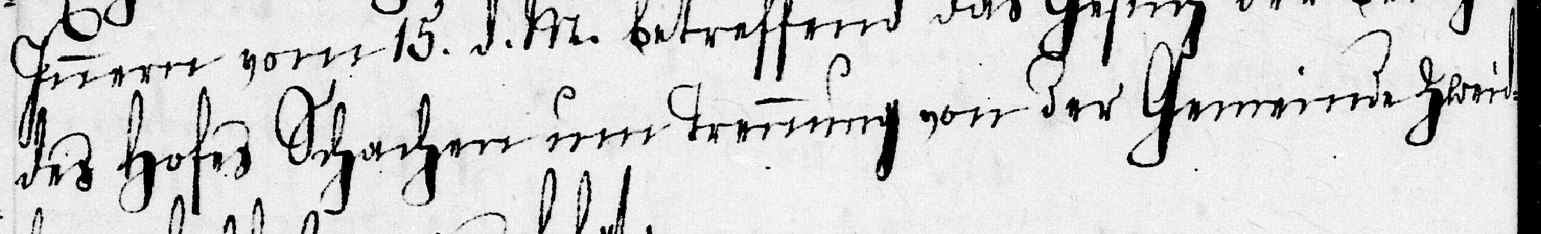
des Hofes Schachen um Trennung von der Gemeinde Zwei¬
